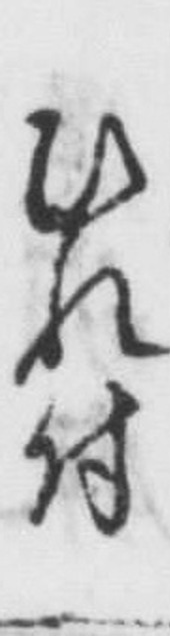ひれ付
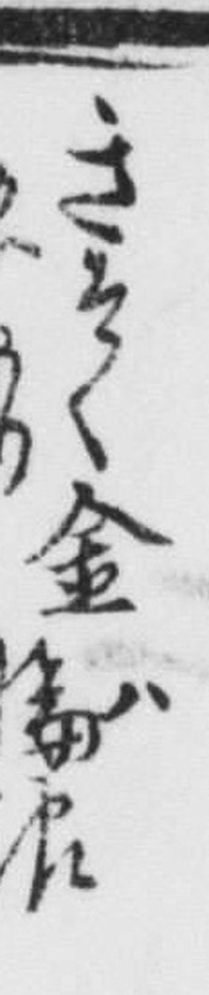きそく金羊
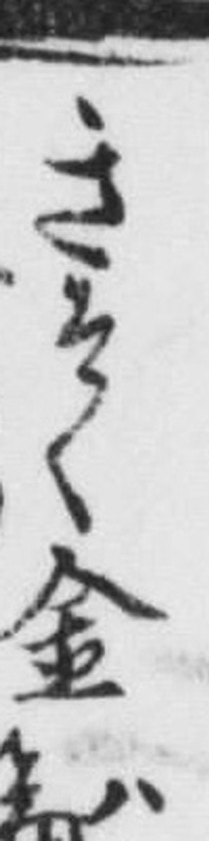きそく金
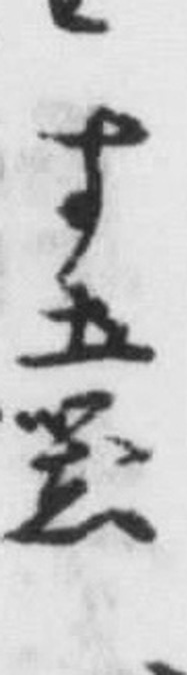耳土器
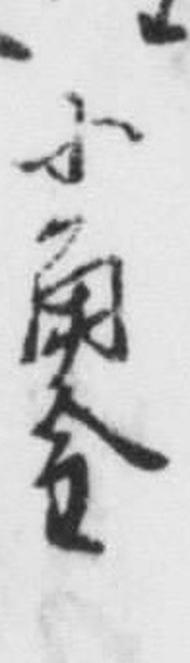小角金
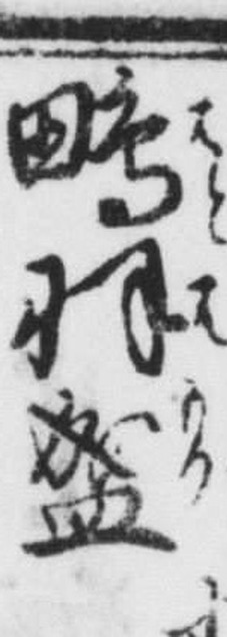鴫羽盛
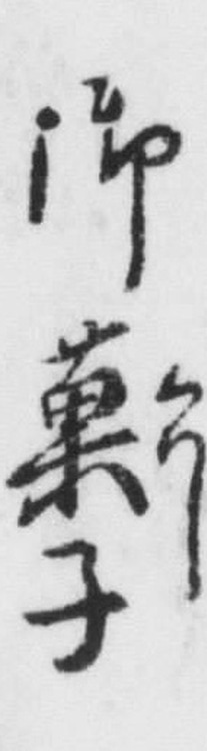御菓子
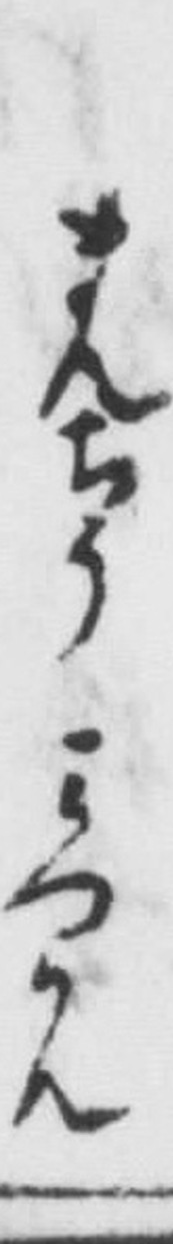まんちうミつかん
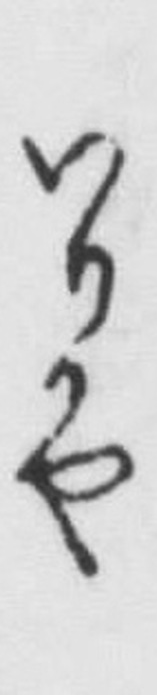いりかや

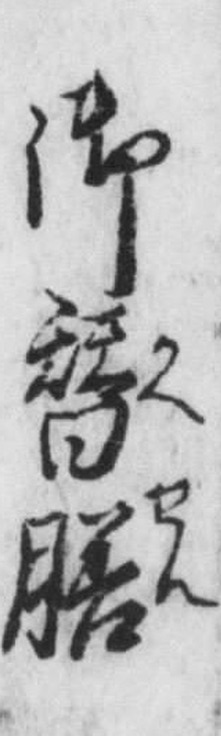御替膳
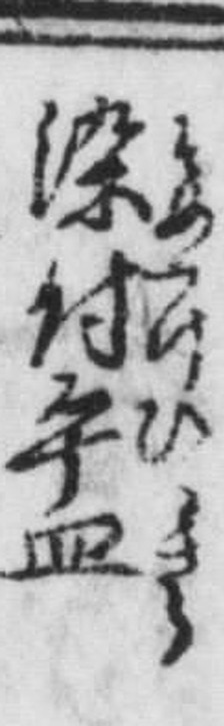染付平皿
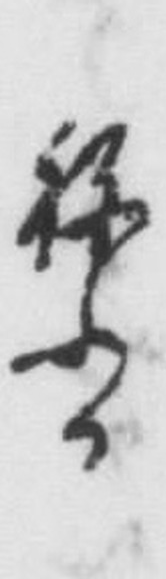ねふか
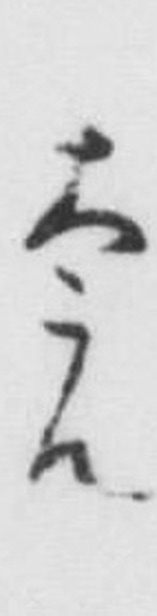大こん
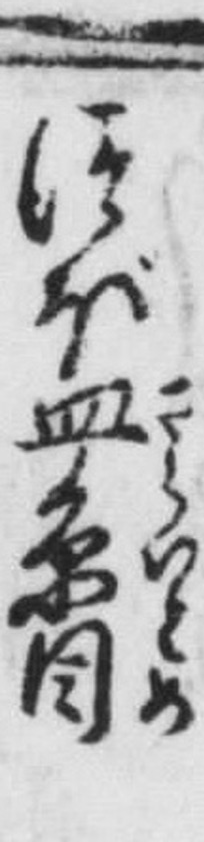つぼ皿糸目
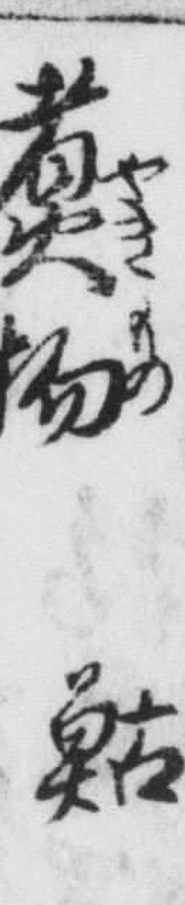煮物鮎
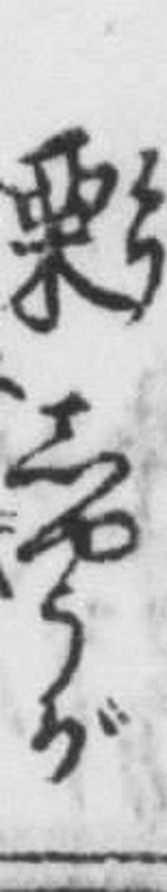栗しやうが
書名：料理切形秘伝抄
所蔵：大阪府立大学学術情報センター 国文学研究資料館
